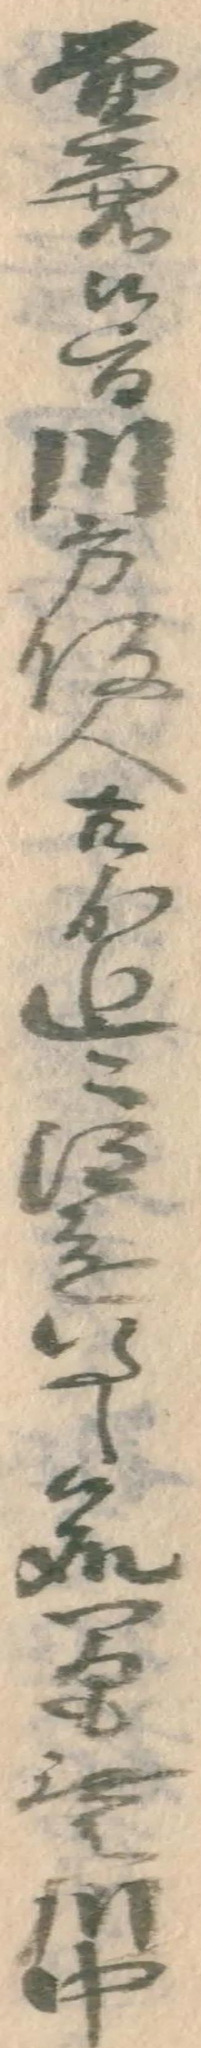届兼候旨川方役人共ゟ追々注進いたし候処間も無之川中
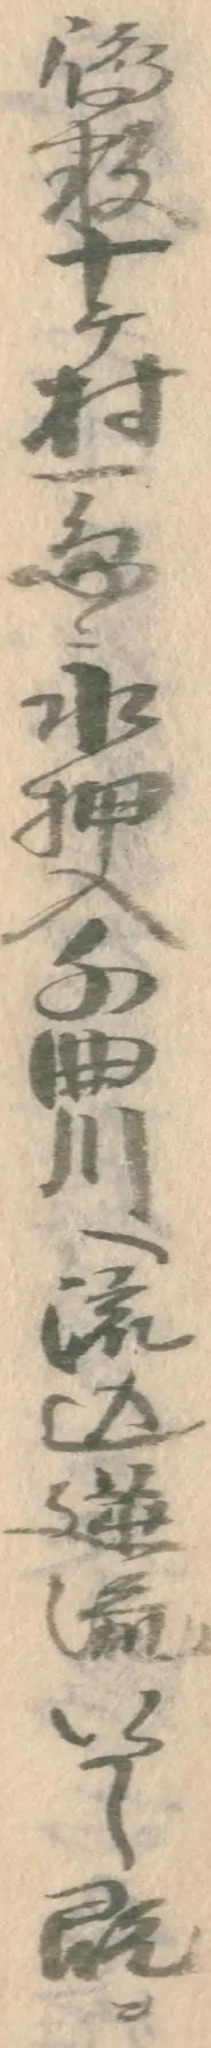島数十ケ村一円ニ水押入千曲川江流込逆流いたし既ニ
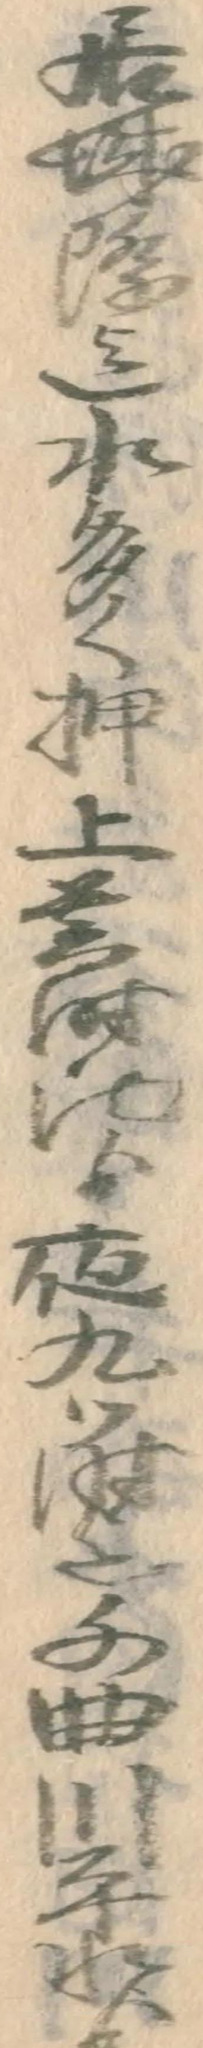居城際迄水多く押上暮時比ゟ夜九ッ時迄千曲川平水ゟ

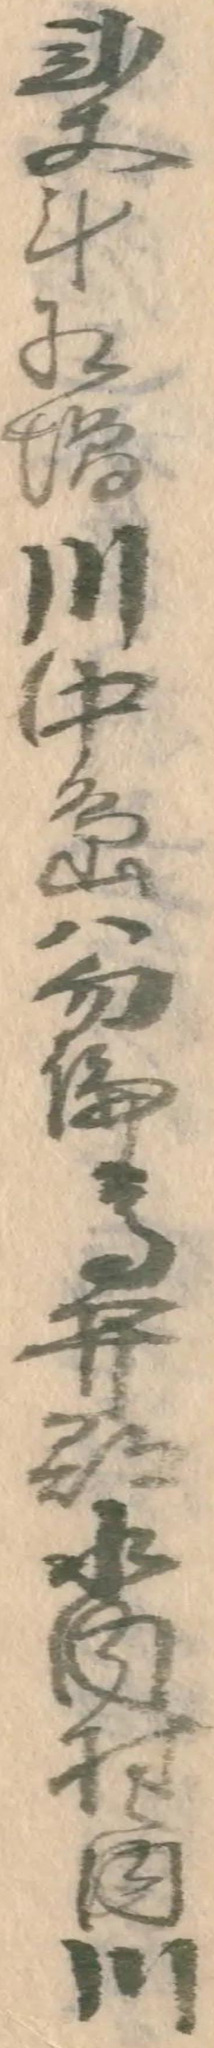弐丈計相増川中島ハ勿論高井郡水内村之内川
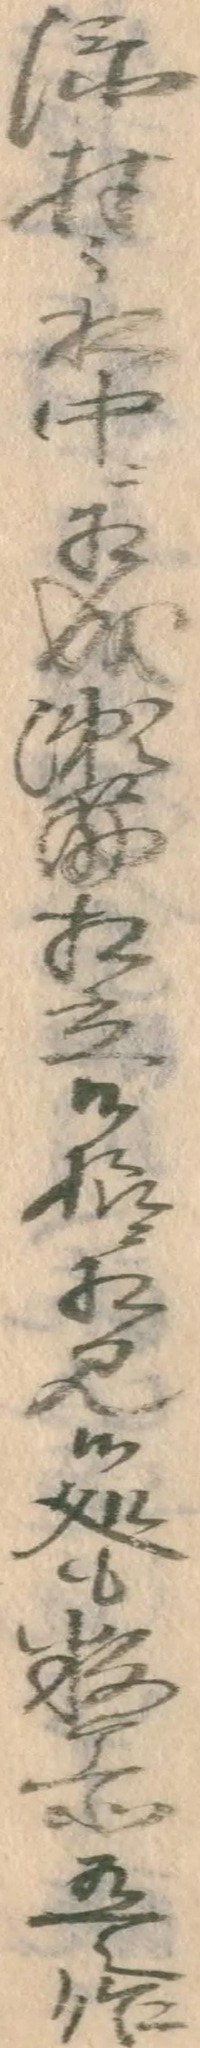添村々水中ニ相成瀬筋相立候様二相見候処も数所有之作
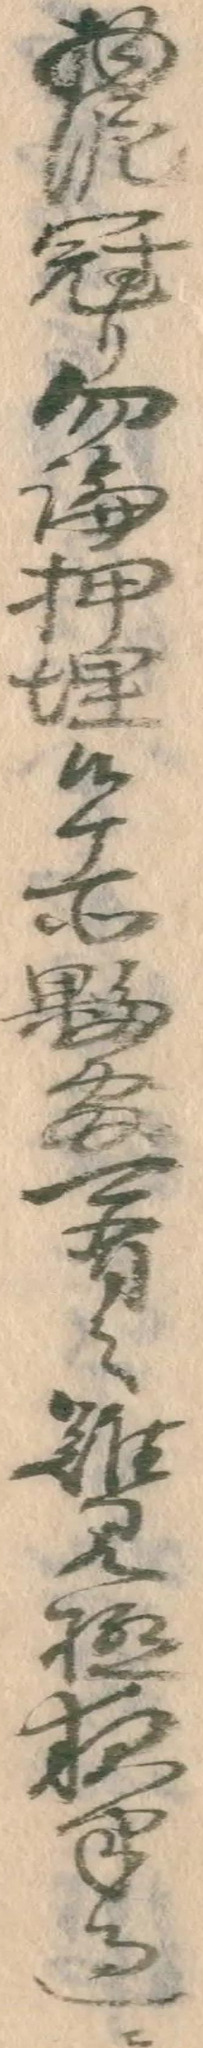物泥冠り勿論押埋候ヶ所夥敷可有之難見極夜半過ニ
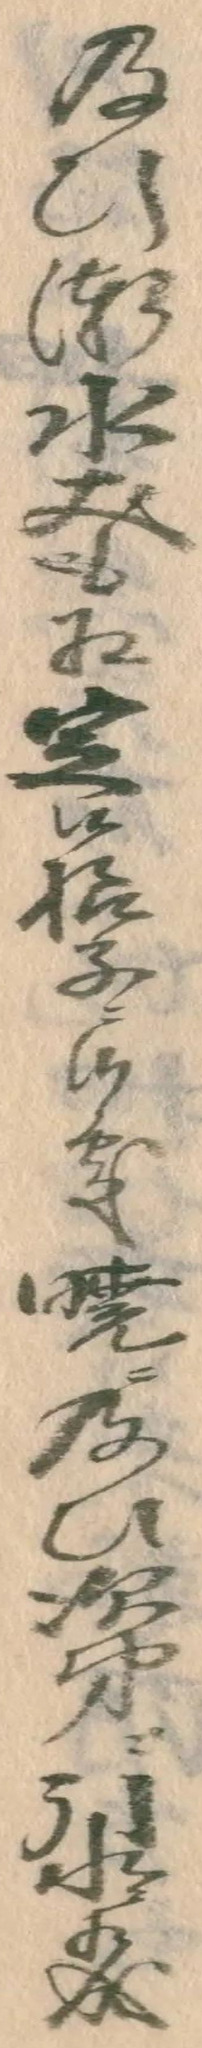及ひ漸水丈も相定候様子ニ候処暁ニ及ひ次第ニ引水ニ相成
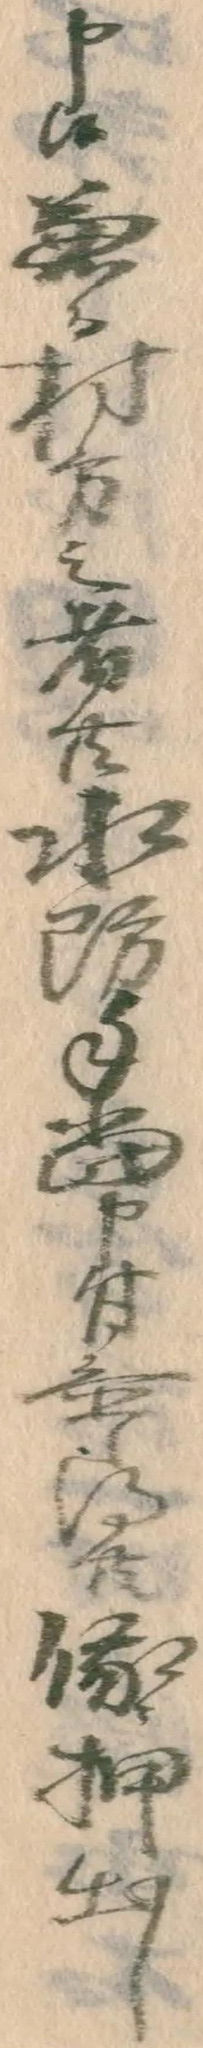申候兼而村方之者共水防手当申付置候得共俄押出し
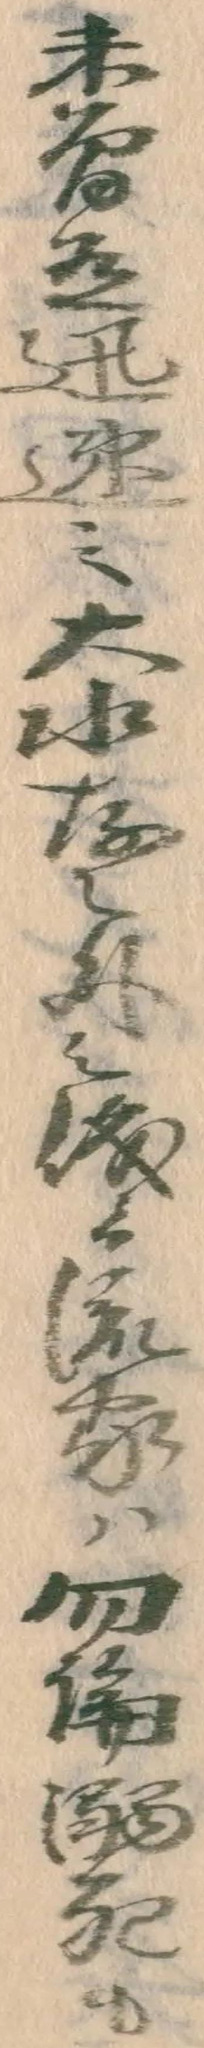未曾有迅束之大水存之外之儀ニ而流家ハ勿論溺死も
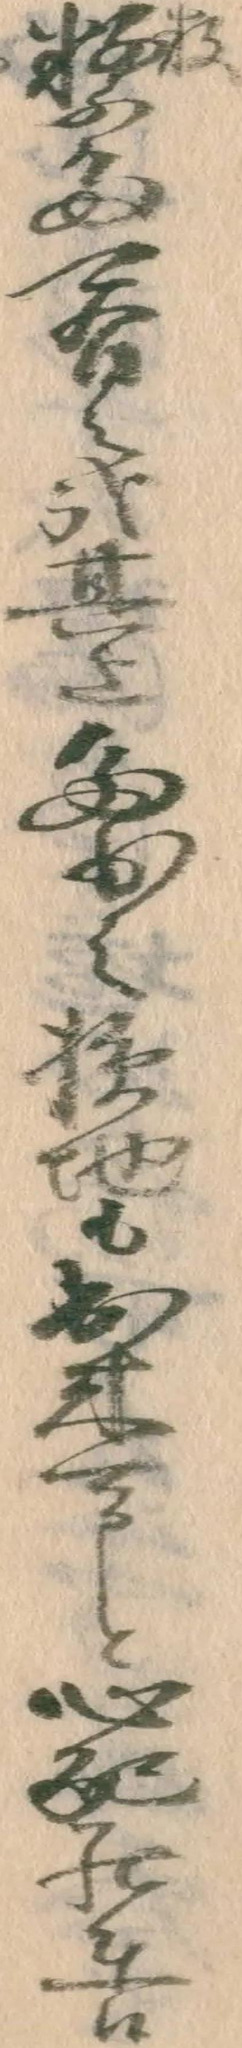数多有之哉其上多分之損耗も出来いたし心配罷在候
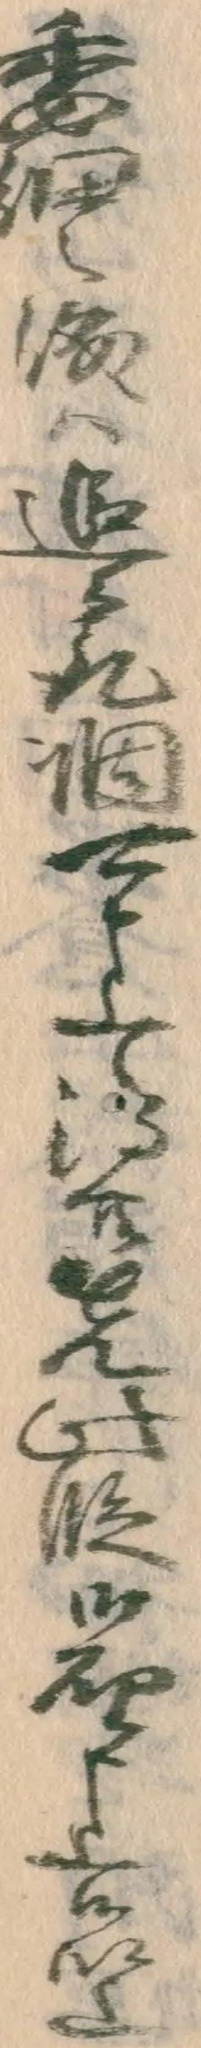委細之儀ハ追而取調可申上候得共先此段御届申上候以上
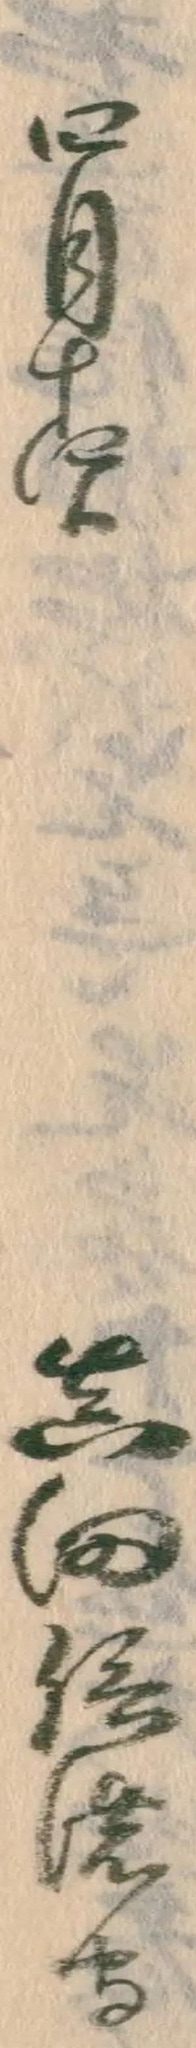四月十四日真田信濃守
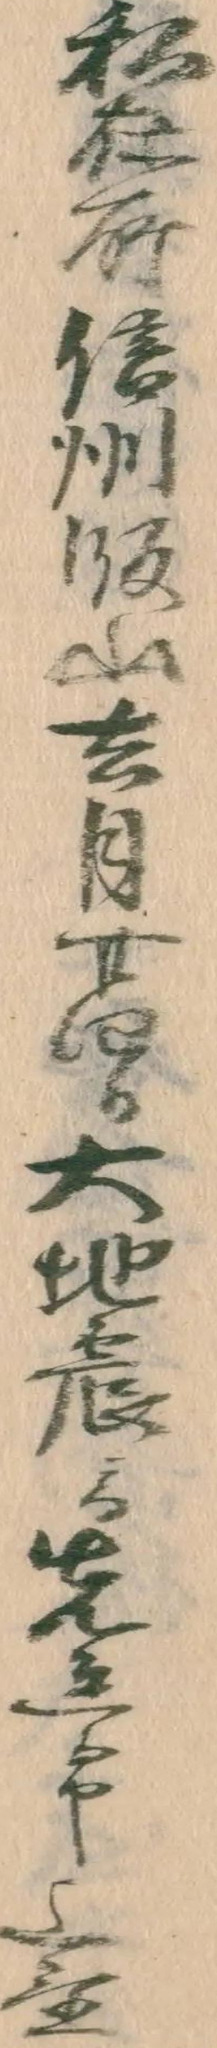私在所信州飯山去月廿四日大地震ニ而先達而申上置
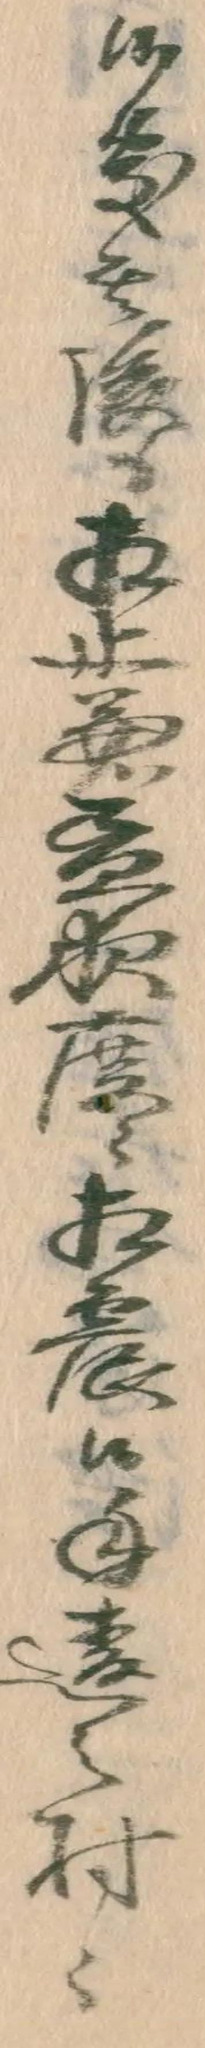候処其後も相止兼昼夜度々相震候手遠之村々
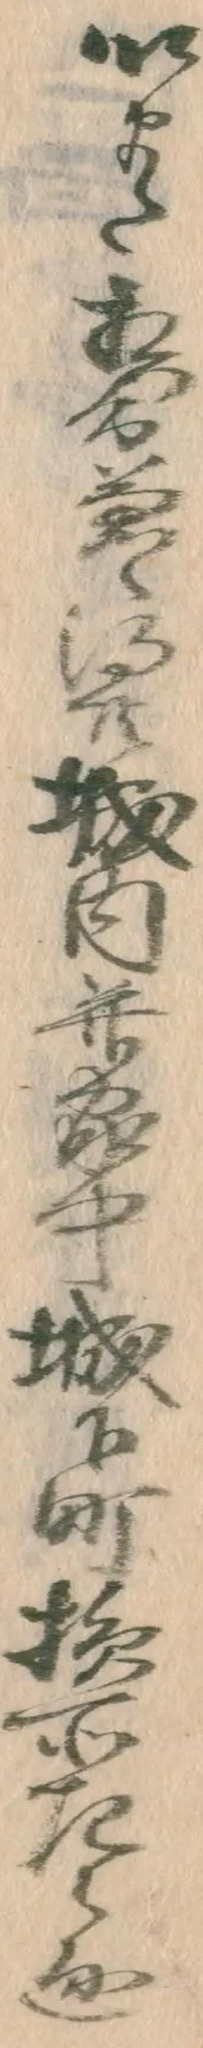いまた相分り兼候得共城内并家中城下町損所左之通
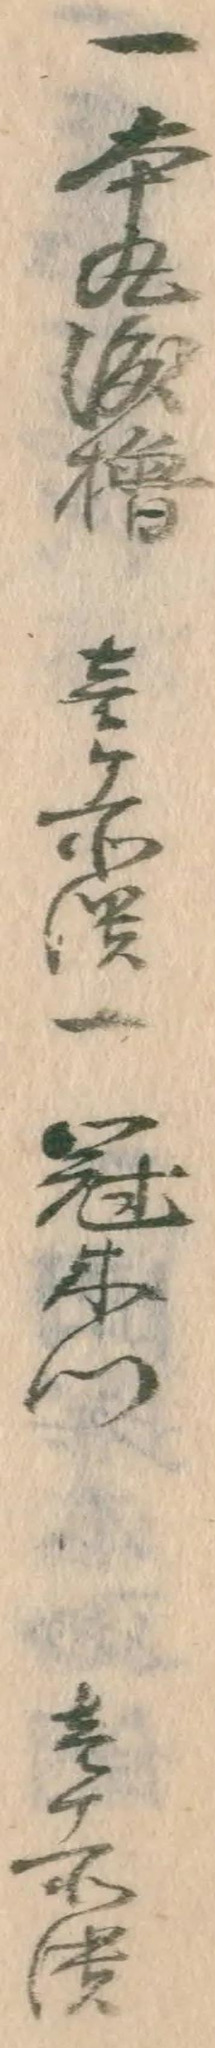一本丸渡櫓一ケ所潰一冠門壱ヶ所潰
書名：信州大地震之記
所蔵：国立国会図書館 National Diet Library, JAPAN
